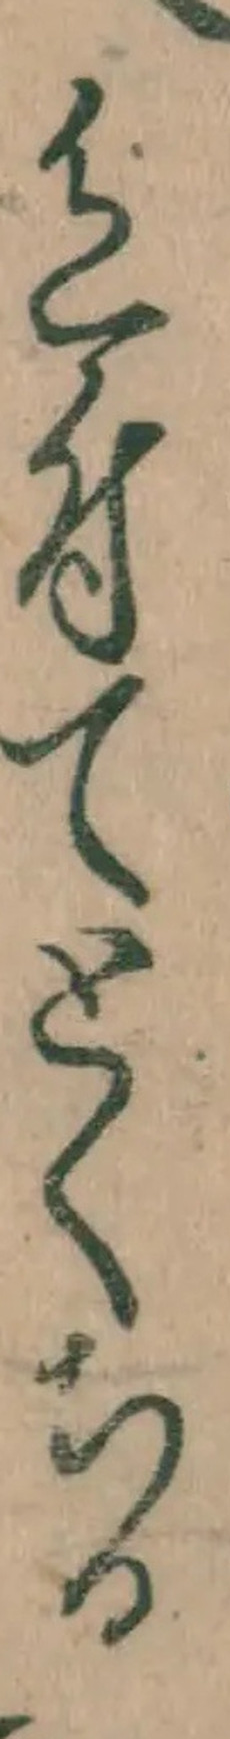色付てとくちる
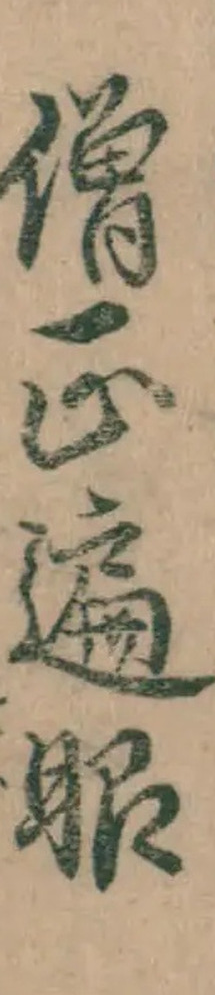僧正遍昭
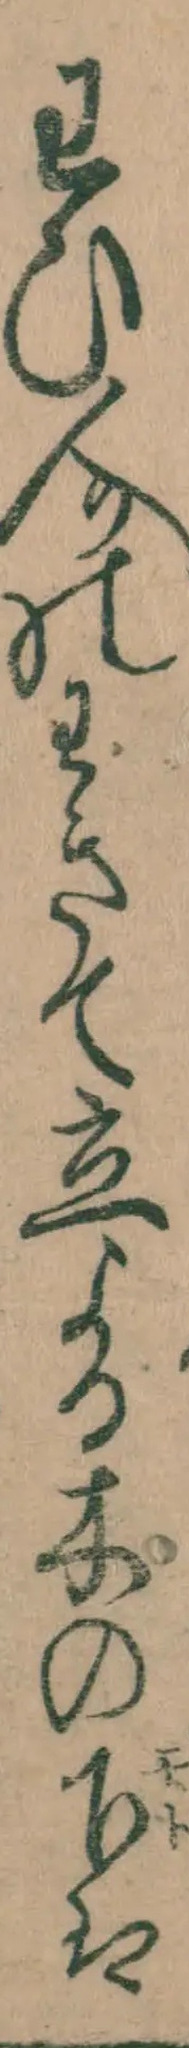わひ人ののわきて立よる木の下は
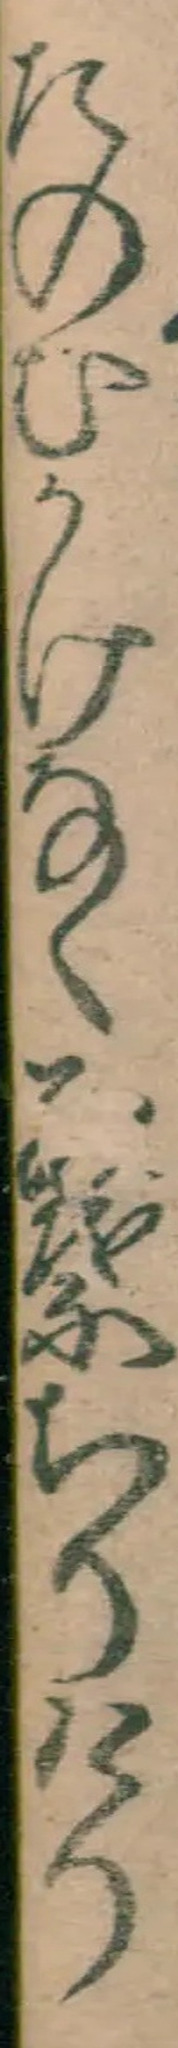たのむかけなく紅葉ちりけり
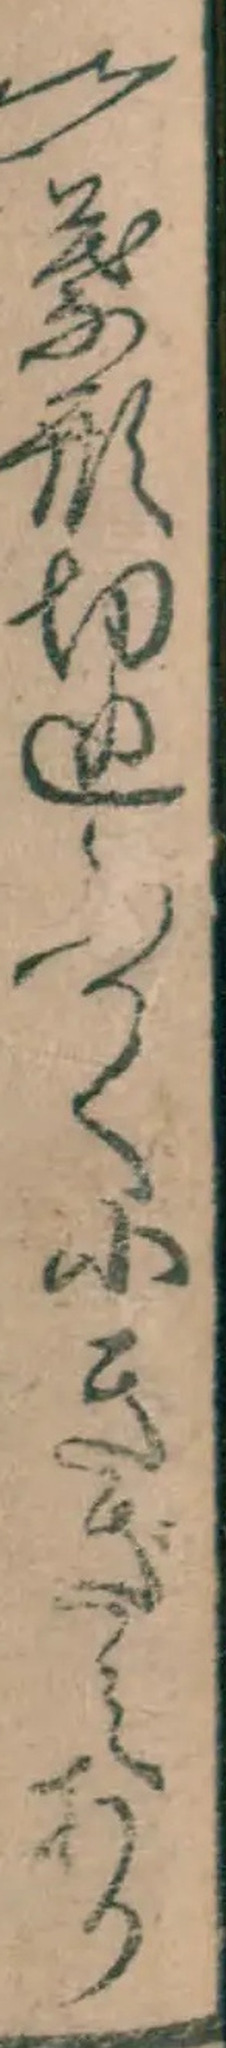待風葉形切込ふかく小きざみあり
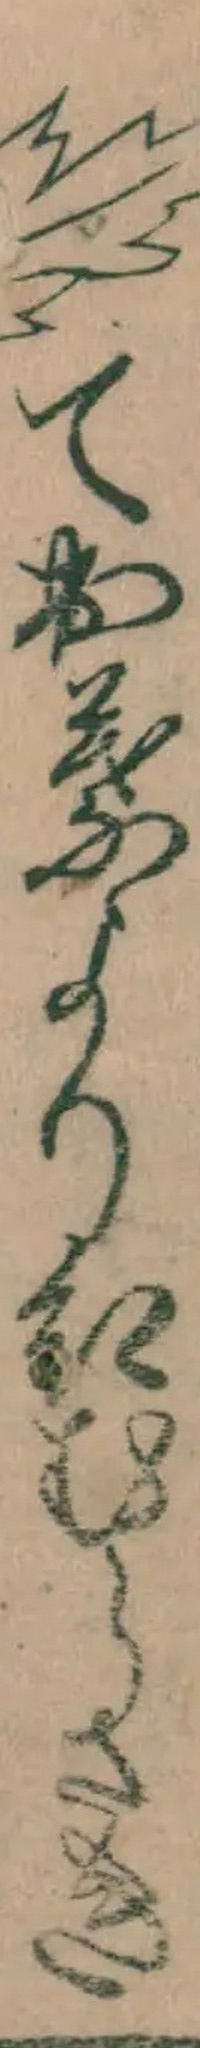て出葉より紅むらさき
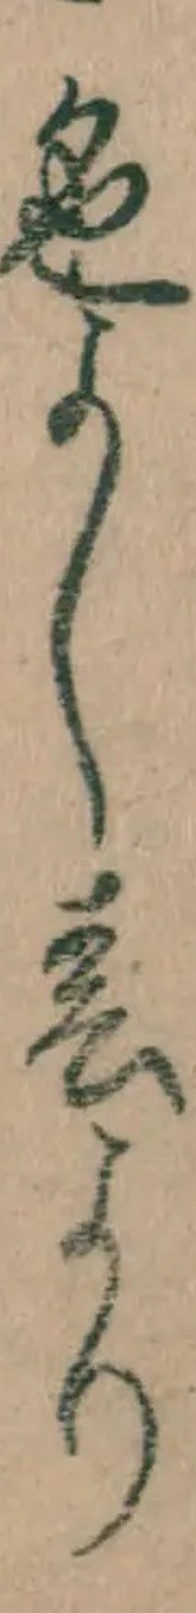色よし春より
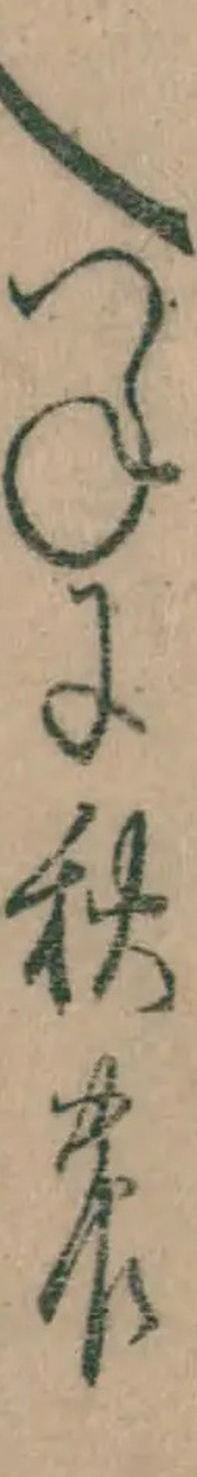つねに秋の
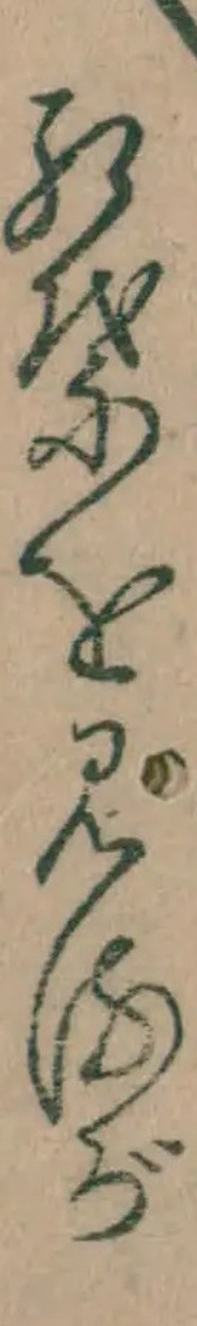紅葉を見るが
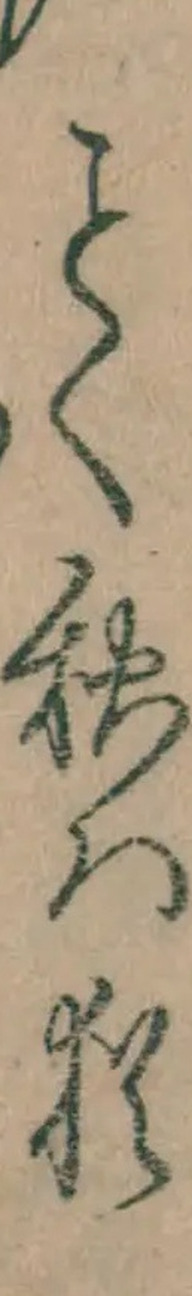ことく秋は猶
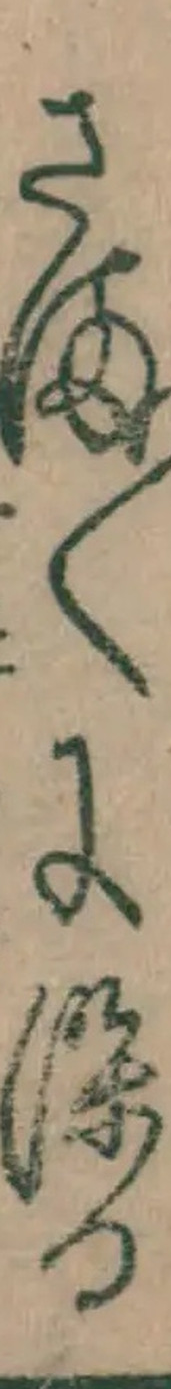さま〳〵に染る
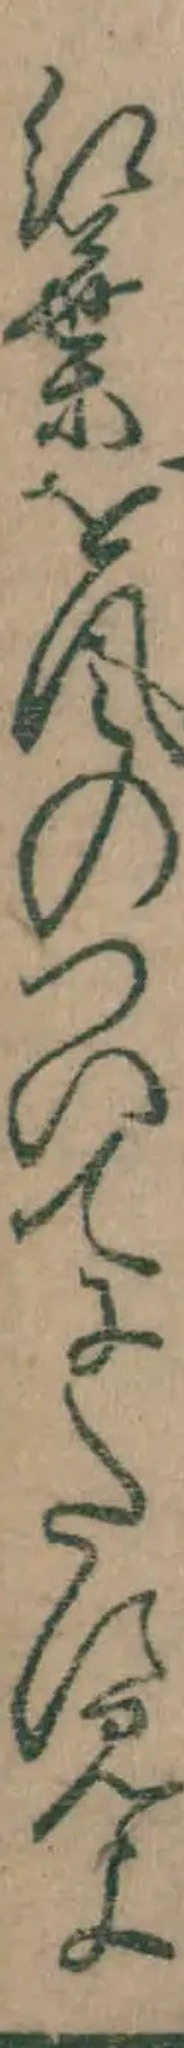紅葉を風のついてにたに見よ

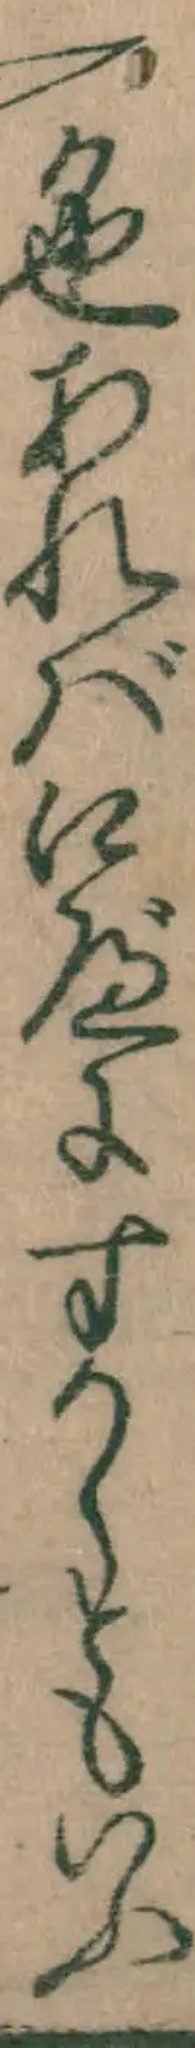色あれば口紅すかしともいふ
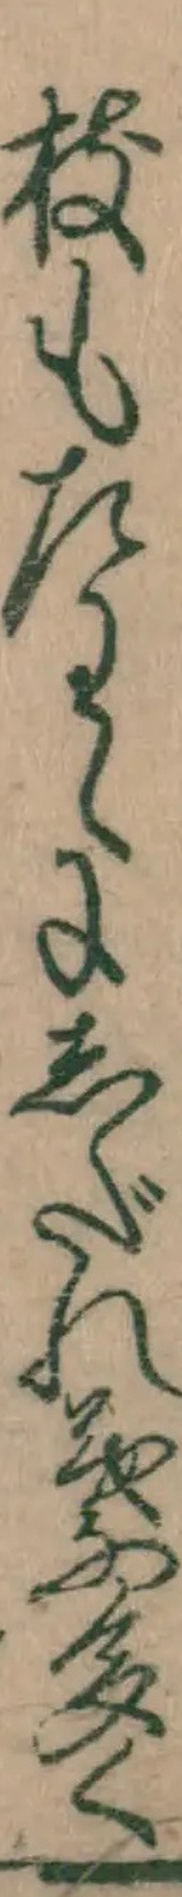枝もたわゝにしだれ葉多く
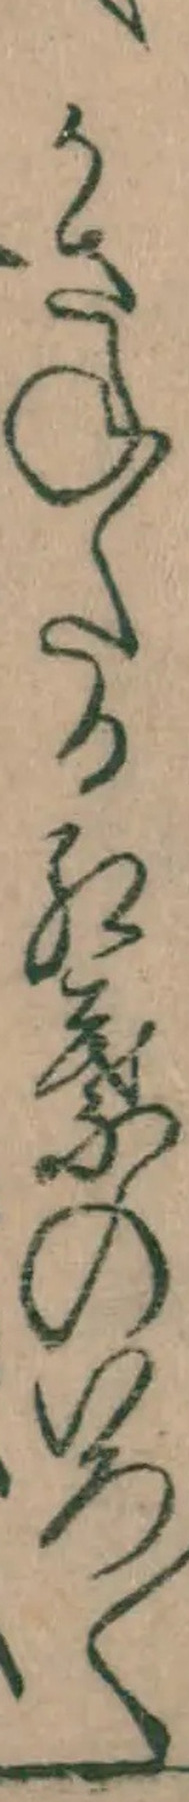かさねたる紅葉のいろ〳〵
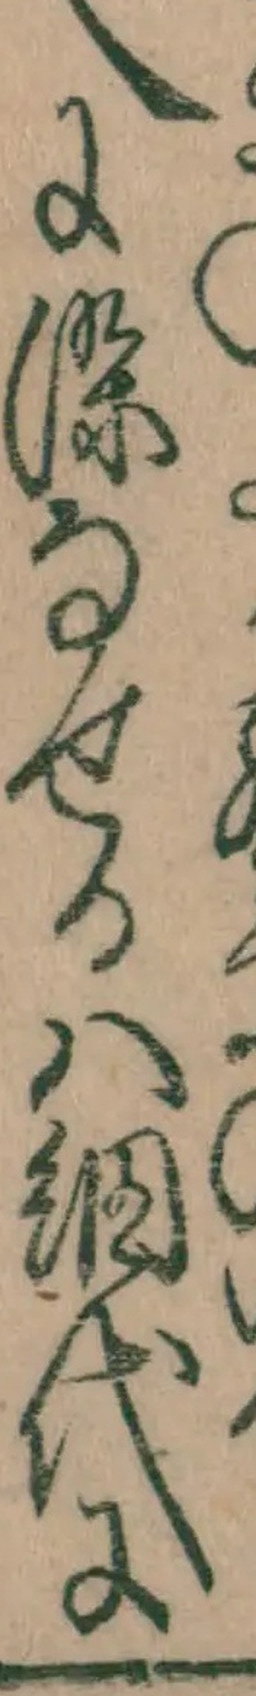に染なせるは網代に
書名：紅葉集
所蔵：国立国会図書館 National Diet Library, JAPAN
